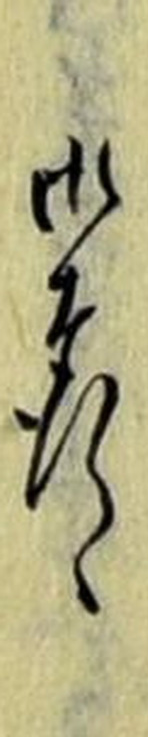御奉行へ
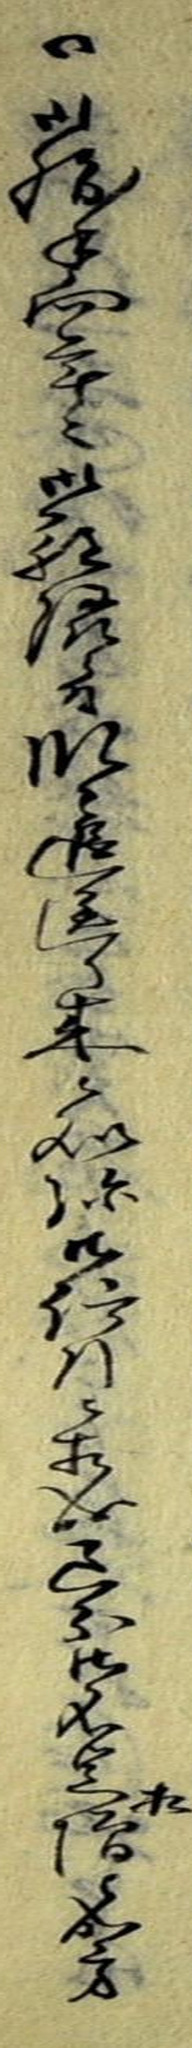〇御勝手向年々御難渋に付段々追送り来候処弥御跡引に相成過分御不足相増被成方

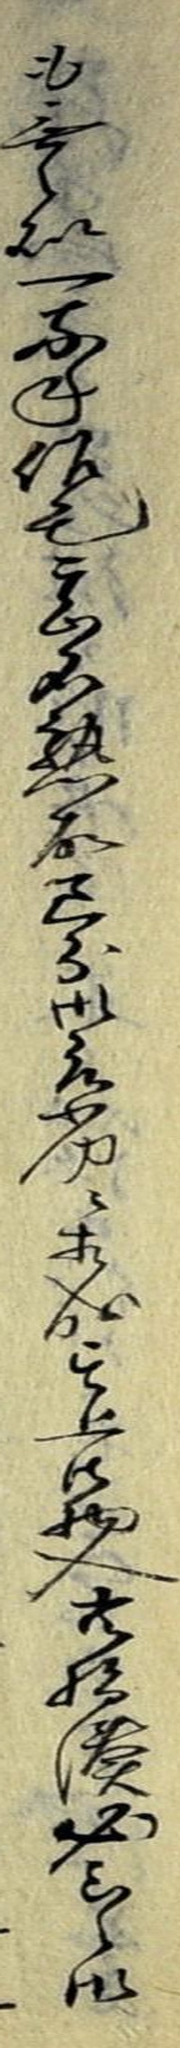も無之処一両年作毛甚不熟故過分御取劣に相成其上御物入共指湊必至之御
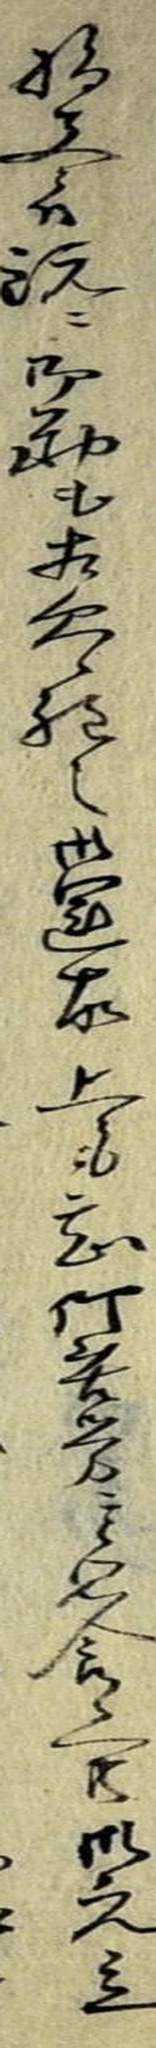指支に付既に御勤も相欠候程之御運故上にも甚御苦労に被思食候へ共御元立
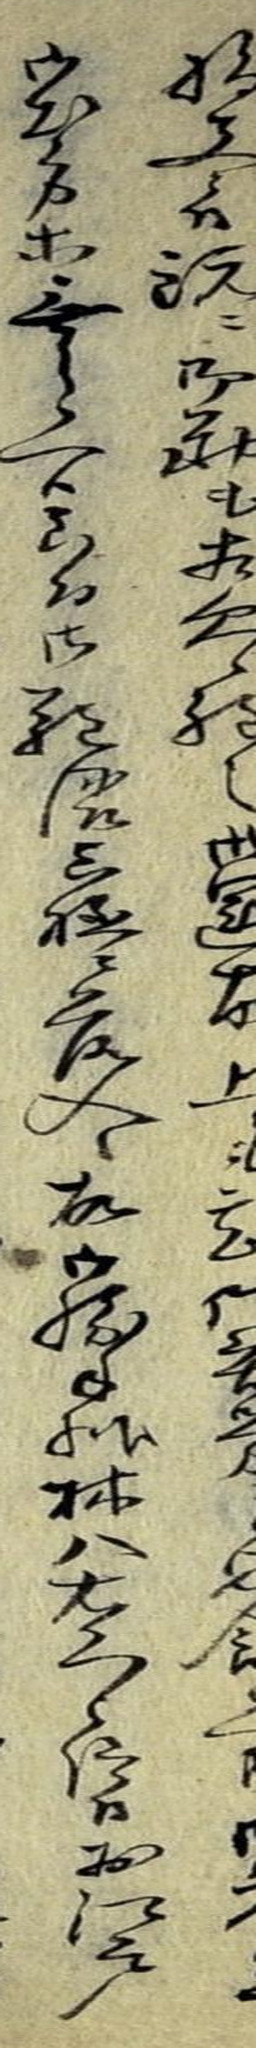御出方等無之候へは至而御難渋至極に落入候故御勝手掛林八右衛門被仰付於江戸
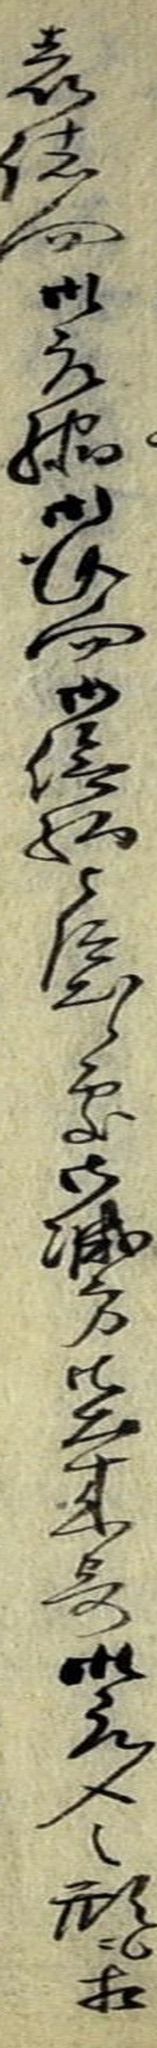表諸向御取御趣向御倹約被仰出候処御減方御出来寄御取〆之形も相
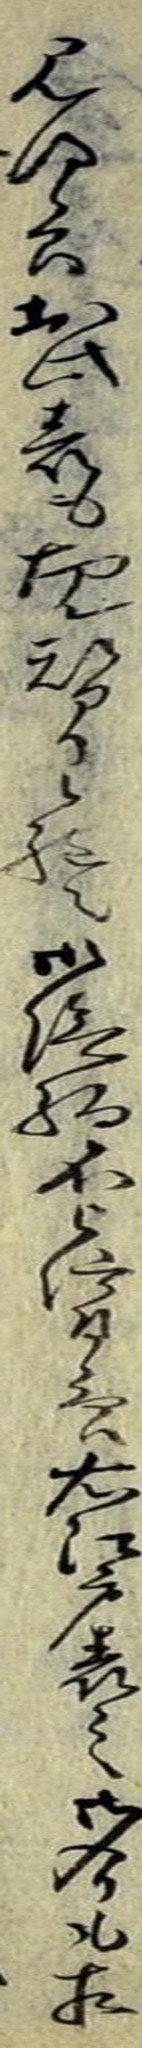見得候間於此表も切れ替り候程之御倹約不被仰付候而は右江戸表之御〆りも相
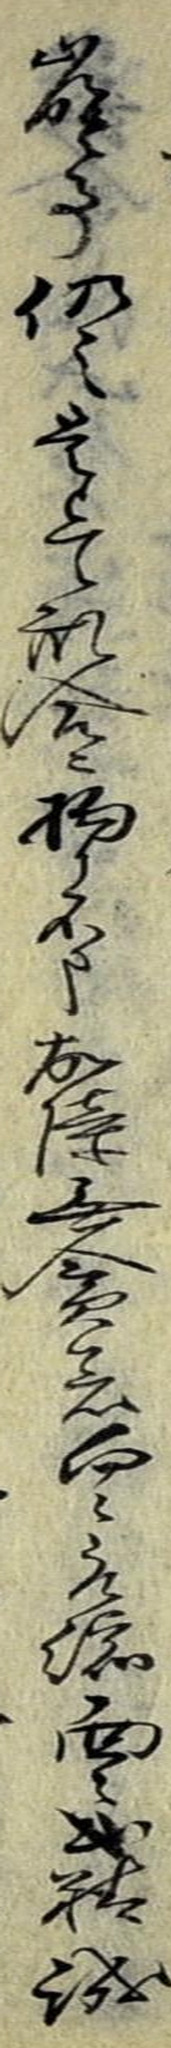崩候事仍之是迄之形合に拘り不申故障無貪着向々取縮面々出精誠
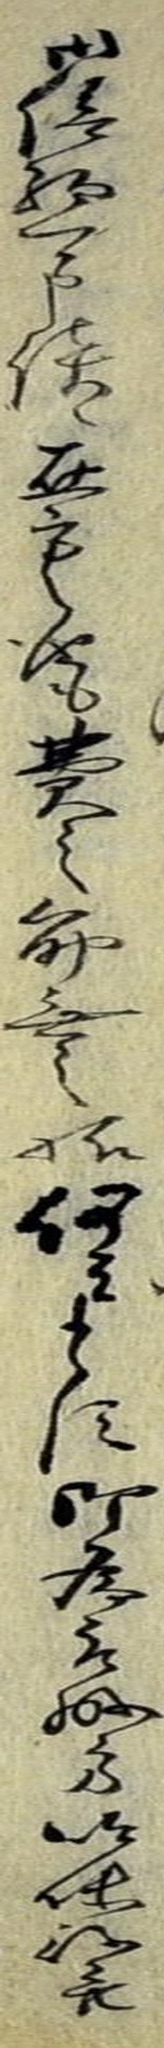御倹約可申談候在方之儀も費之筋無之様何によらず御為取扱方吟味役并
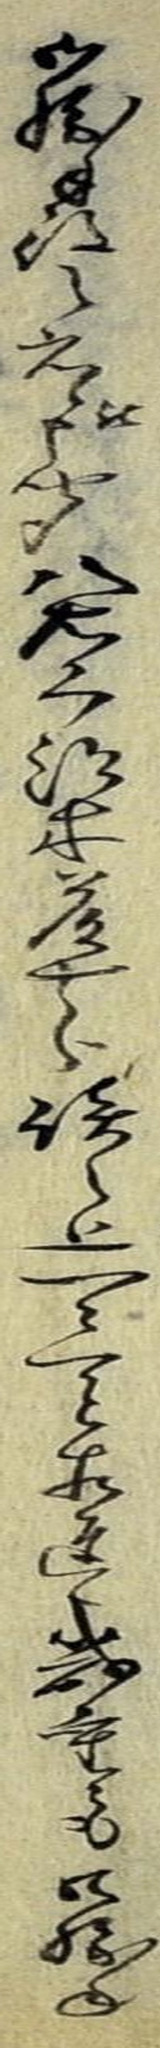御勝手役之者被申聞八左衛門鈴木藤十郎談之上一に可被相達候幾重にも御勝手
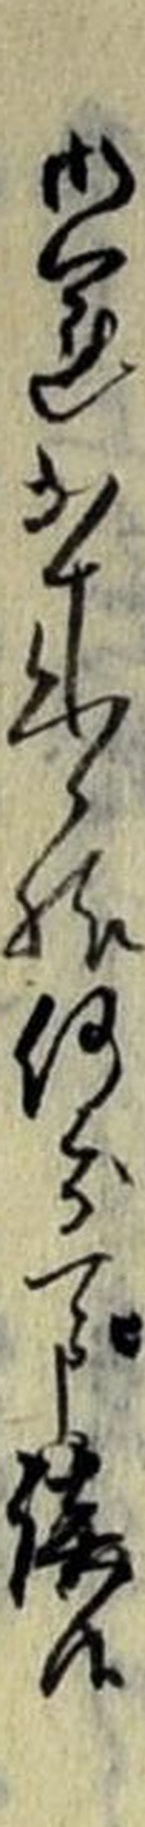御運出来候様何分可申談候
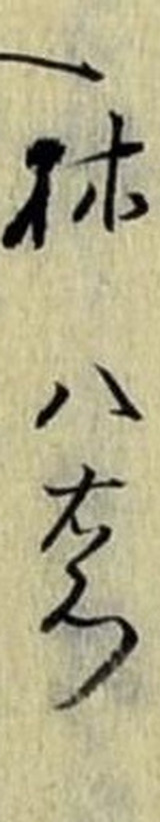林八右衛門
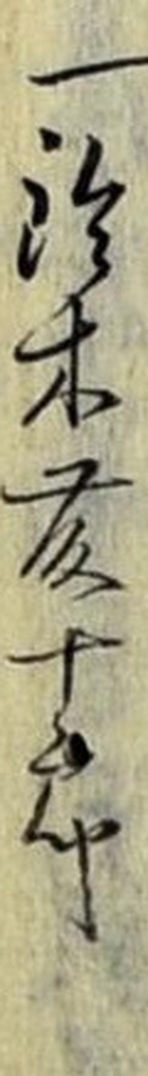鈴木藤十郎
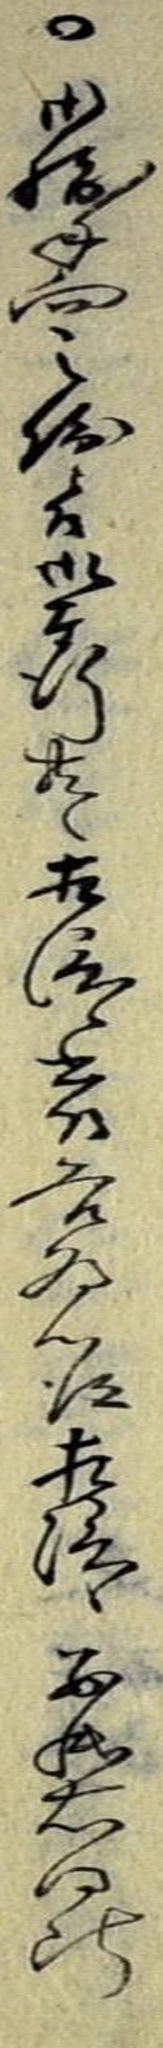〇御勝手向之儀に付御奉行共へ相渡候書付各為心得相渡候別紙右同断
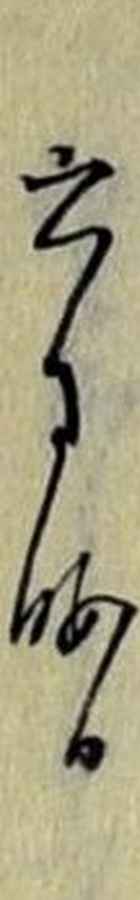六月晦日
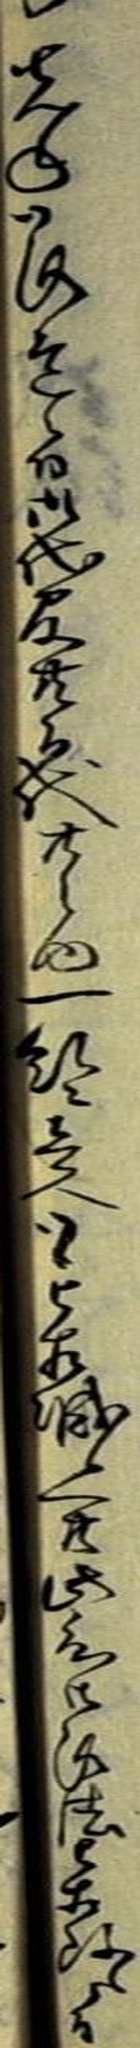〇先年御趣意に付御代官共下代共之内一領に壱人ツヽ被相減候へ共此度御趣法被相改候に付
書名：命令之部 二
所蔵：福井県文書館 Fukui Prefectural Archives
